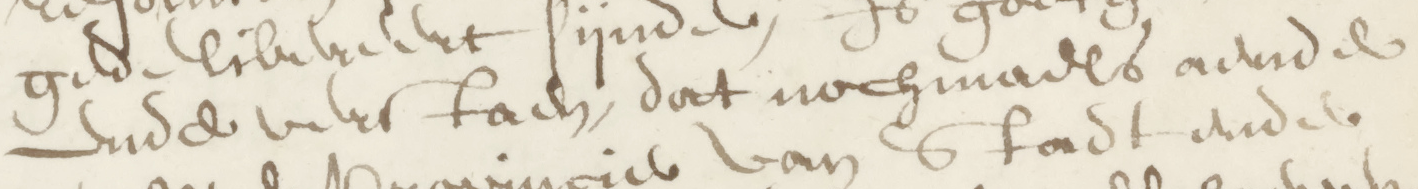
ende verstaen, dat nochmaels aende
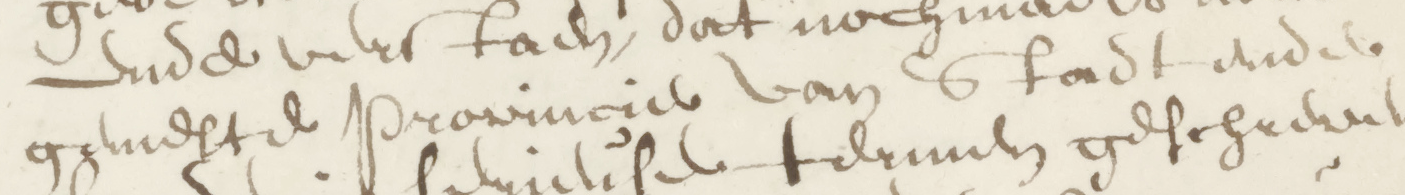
gemelte Provincie van Stadt ende
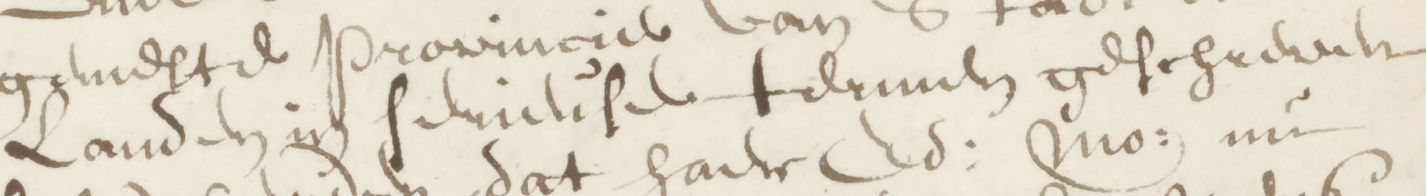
Landen in serieuse termen geschreven
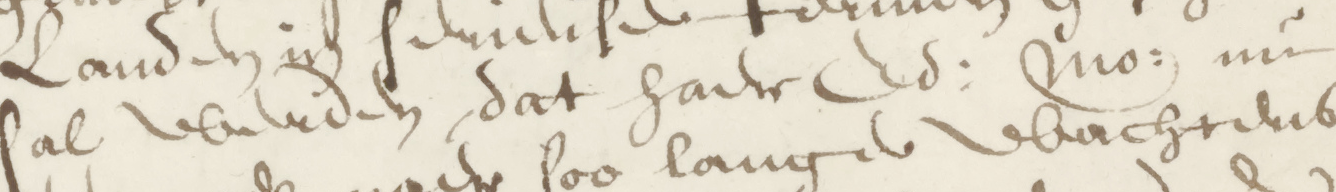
sal werden, dat haer Ed:Mo: nu
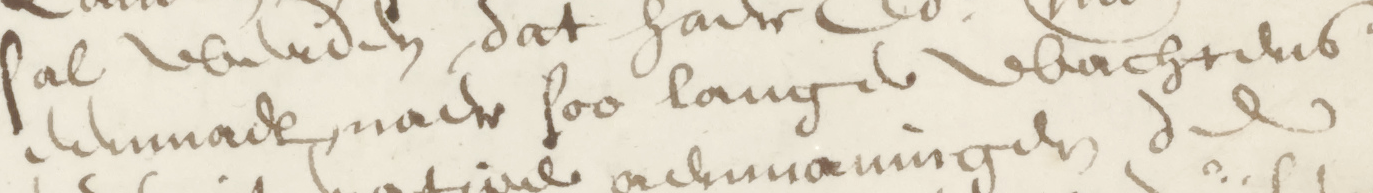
eenmael, naer soo lange wachtens
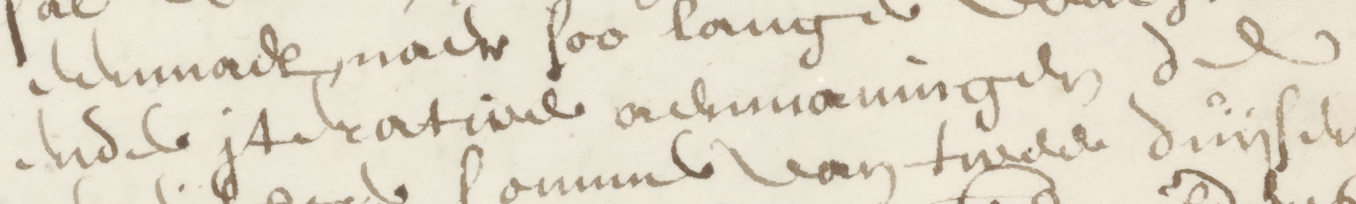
ende iterative aenmaningen de
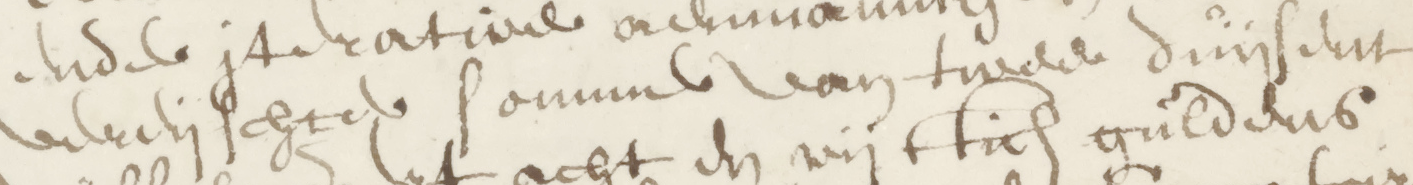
vereijschte somme van twee duijsent
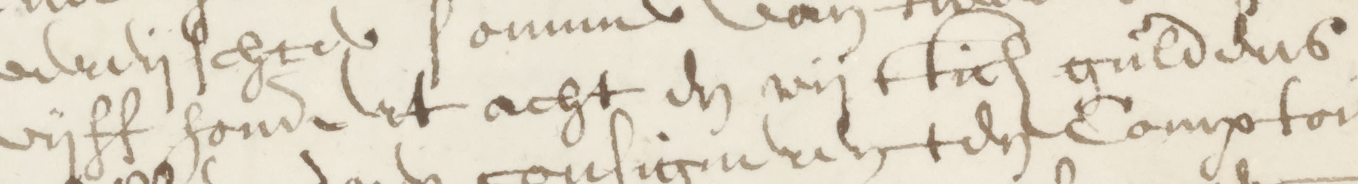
vijff hondert acht en vijftich guldens
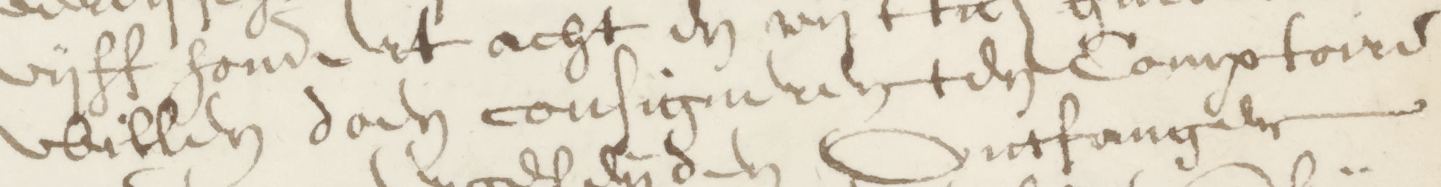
willen doen consigneren ten Comptoire
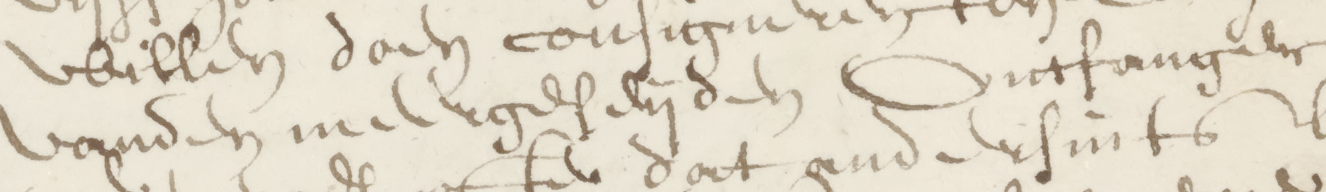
vanden meergeseijden Ontfanger
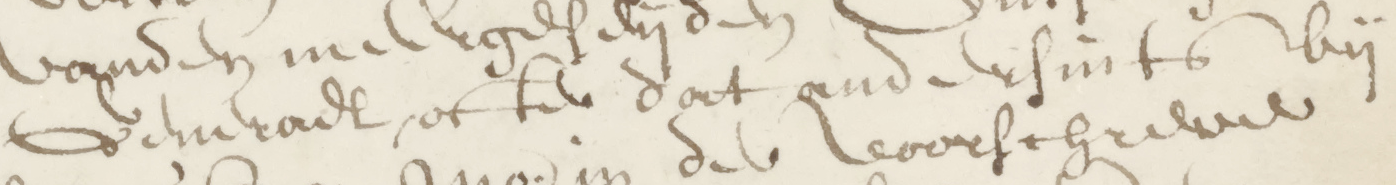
Generael, ofte dat andersints bij
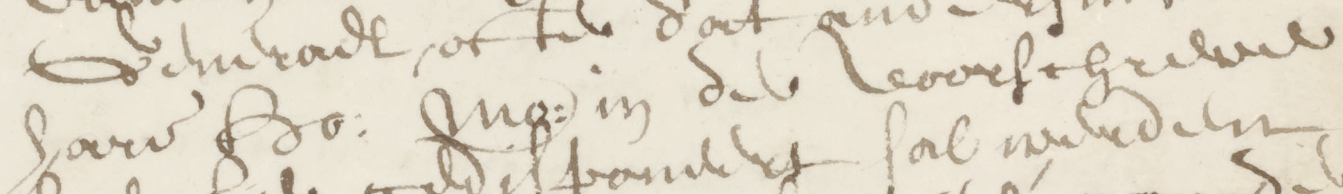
hare Ho:Mo: in de voorschreve
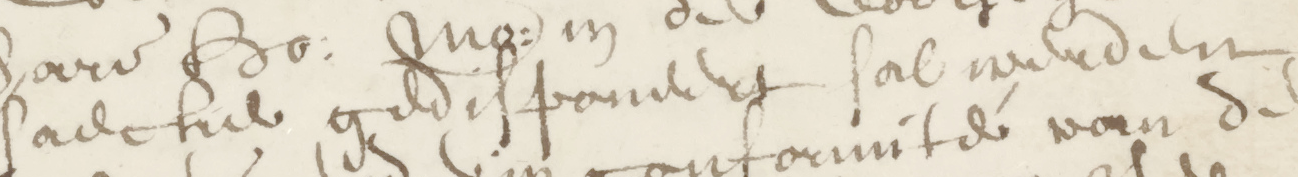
saecke gedisponeert sal werden
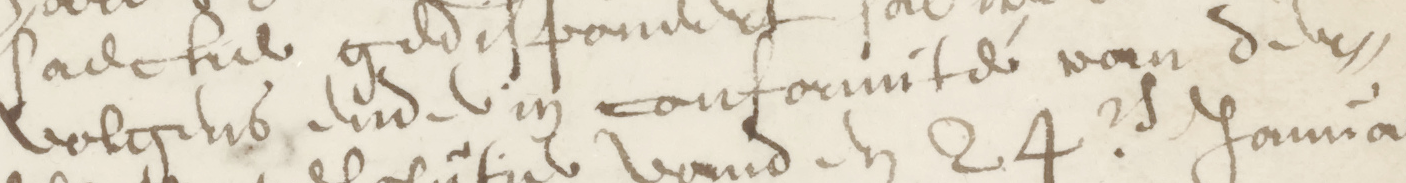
volgens ende in conformité van der„
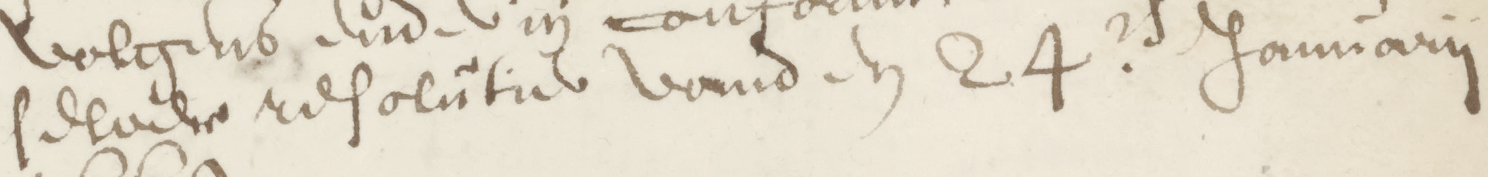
selver resolutie vanden 24e Januarij
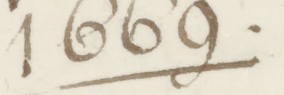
1669.
